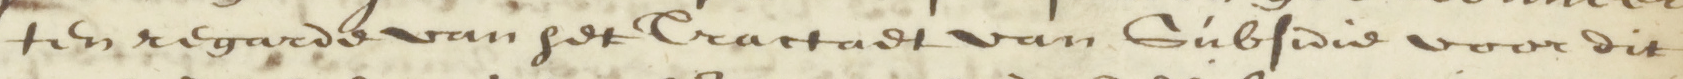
ten regarde van het Tractaet van Subsidie voor dit
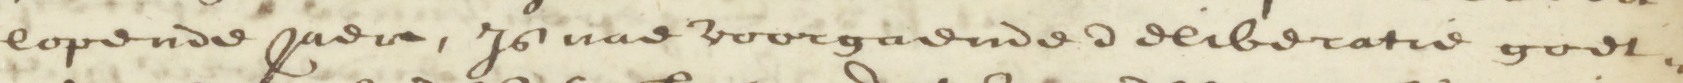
lopende jaer, Is nae voorgaende deliberatie goet„
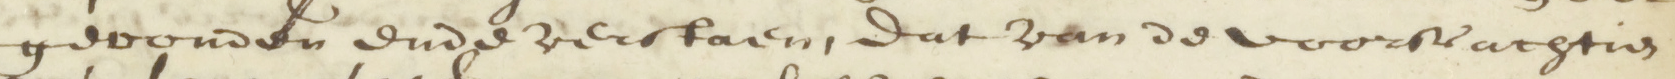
gevonden ende verstaen, Dat van de voorsz achtien
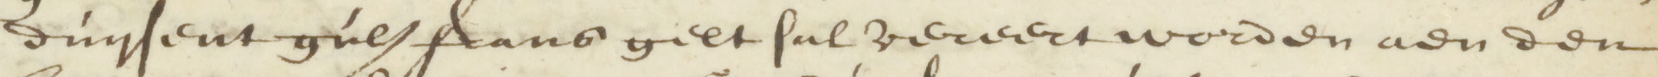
duysent gul Frans gelt sal vereert worden aen den
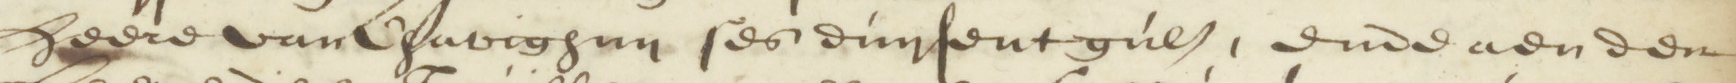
Heere van Chavighny ses duysent gul, ende aen den
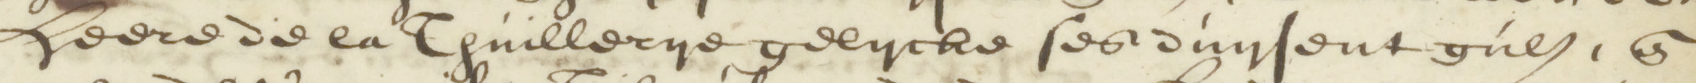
Heere de la Thuillerye gelycke ses duysent gul, en
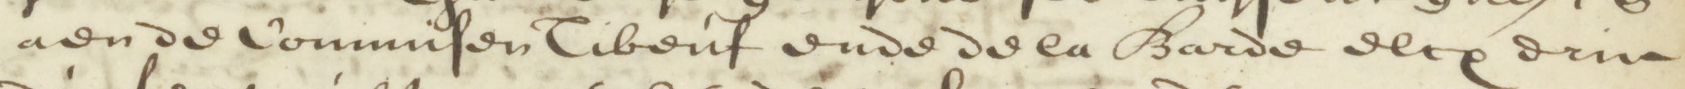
aen de Commisen Tibeuf ende de la Barde elcx drie
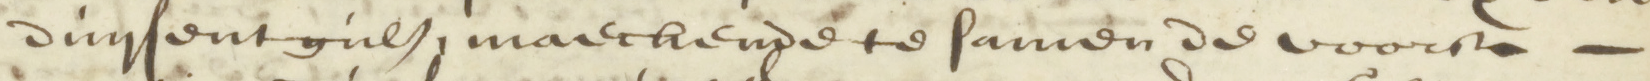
duysent gul, maeckende te samen de voorsz —
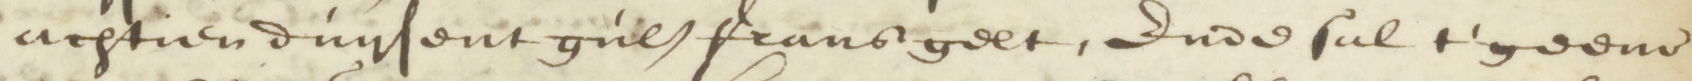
achtien duysent gul Frans gelt. Ende sal t‛geene
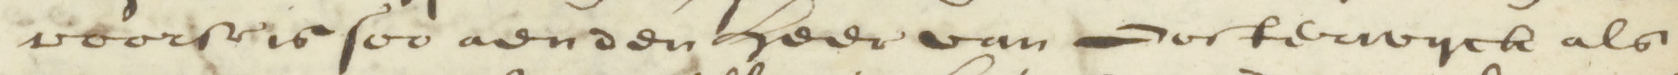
voorsz is soo aen den Heer van Oosterwyck als
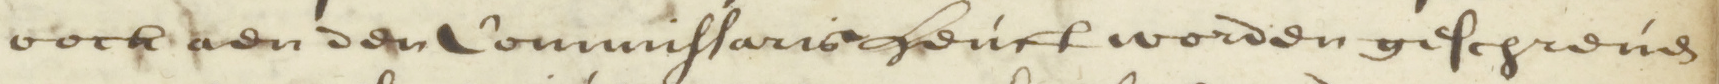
oock aen den Commissaris Heuff worden geschreven
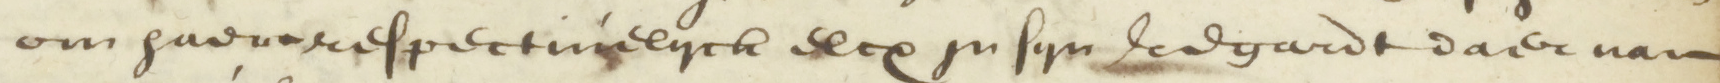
om haer respectivelyck elcx in syn regardt daer nae
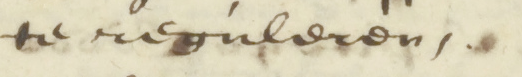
te reguleren.
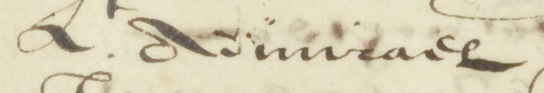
Lt. Admirael
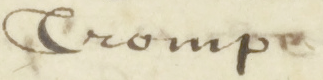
Tromp
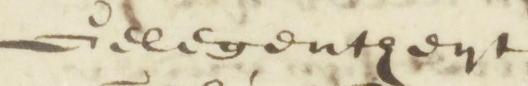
Gelegentheyt
